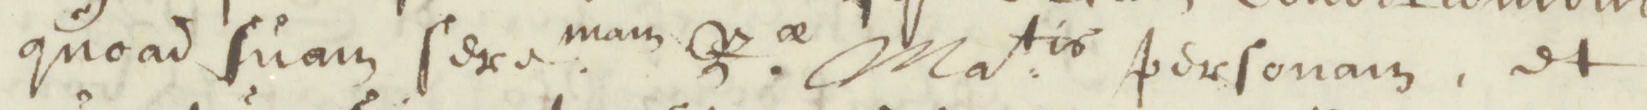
quoad suam seremam. Ræ. Matis. personam, et
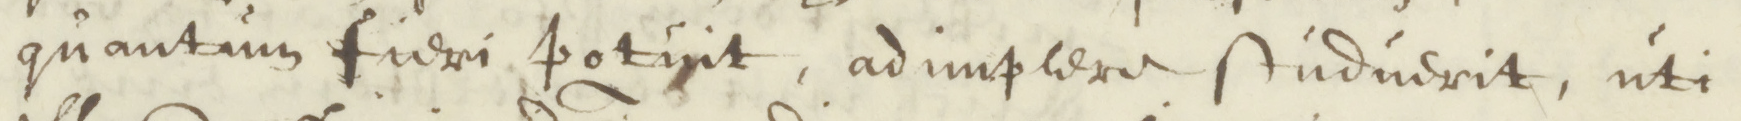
quantum fieri potuit, ad implere studuerit, uti
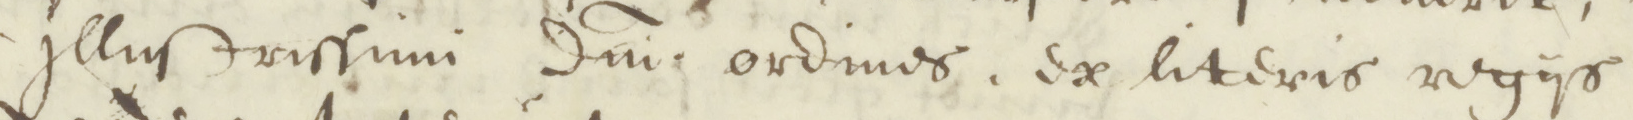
Illustrissimi Dni. ordines, ex literis regiis
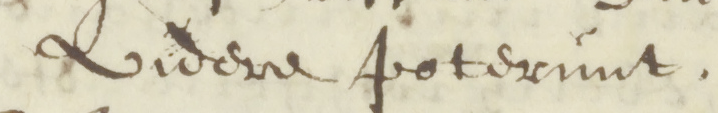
videre poterunt.
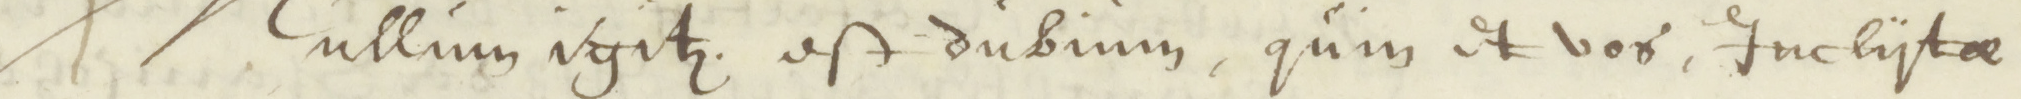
Mullum igit est dubium, quin et vos, Incliitæ
